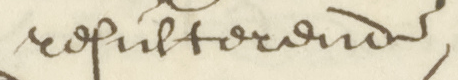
resulterende.
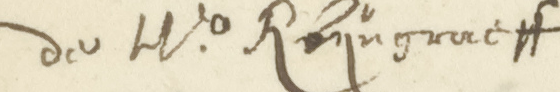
de Hr. Rhijngraeff
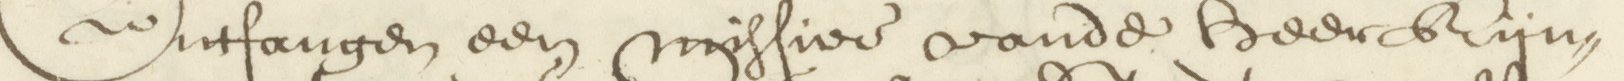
Ontfangen een missive vande Heer Rijn,
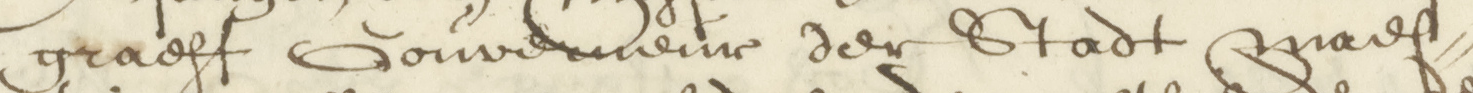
graeff Gouverneur der Stadt Maes,,
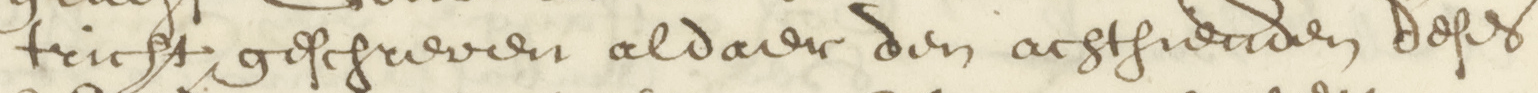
tricht, geschreven aldaer den achthienden deses
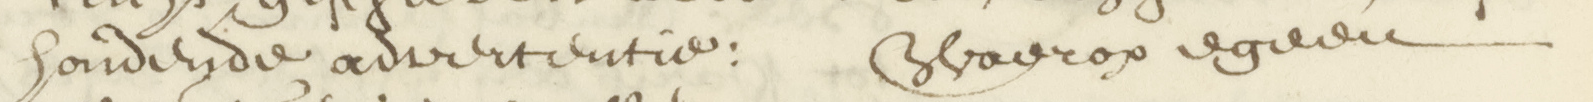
houdende advertentie: Waerop egeen
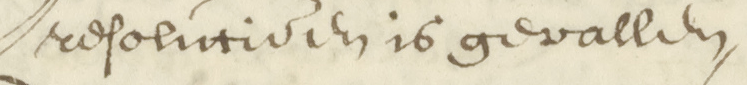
resolutieen is gevallen.
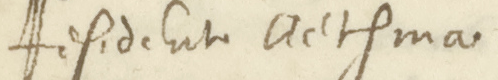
Resident Aetsma
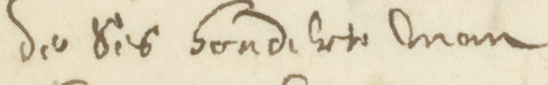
de ses hondert man
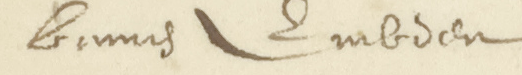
binnen Embden
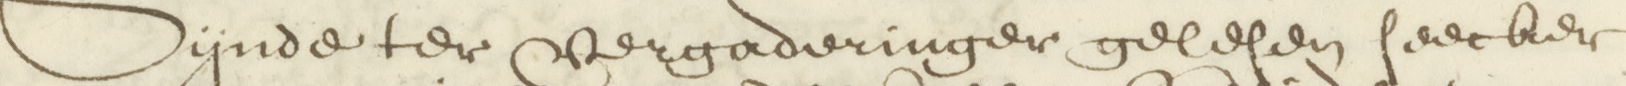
Sijnde ter Vergaderinger gelesen seecker
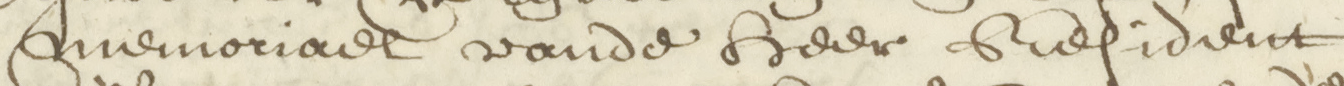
memoriael vande Heer Resident
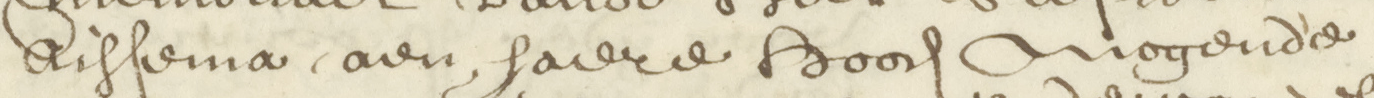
Aissema, aen haere Hooch mogende
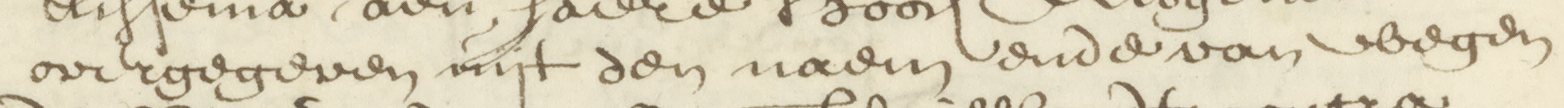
overgegeven uijt den naem ende van wegen
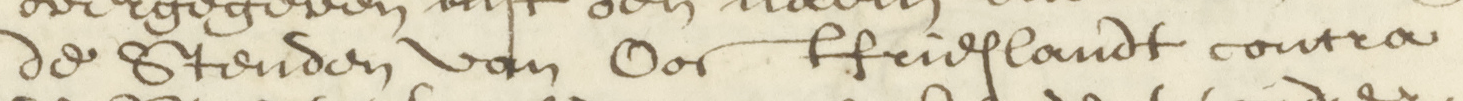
de Stenden van Oostfrieslandt contra
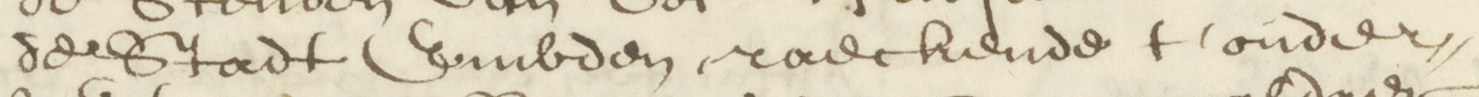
de Stadt Embden, raeckende t'onder„
